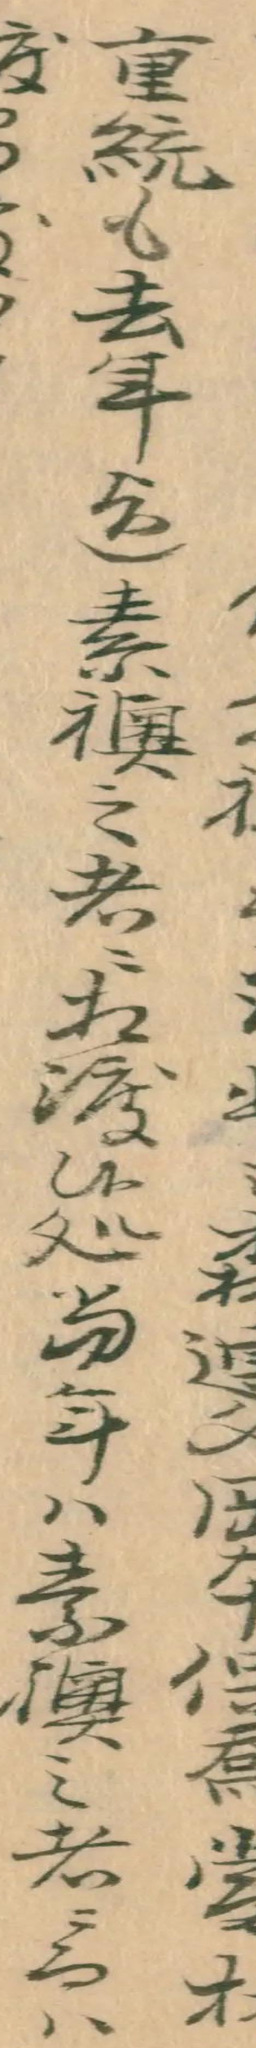重統も去年迄素襖之者ニ相渡候処当年ハ素襖之者ニ而ハ
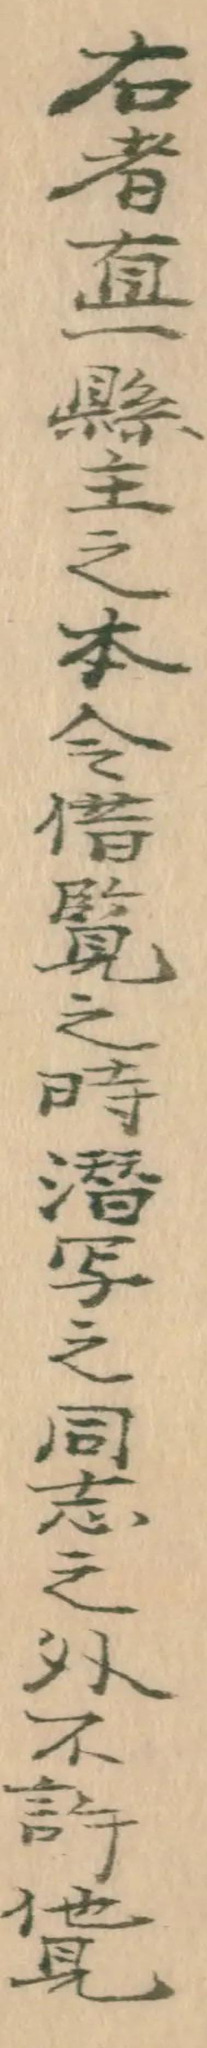右者直一県主之本令借覧之時潜写之同志之外不許他見
